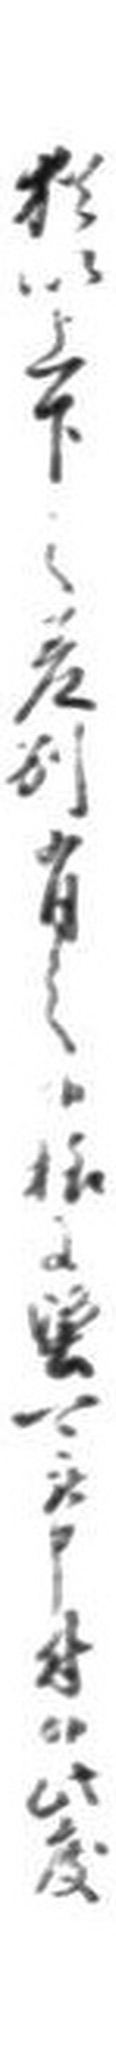猶以上下之差別有之候様に堅可被申付候此度
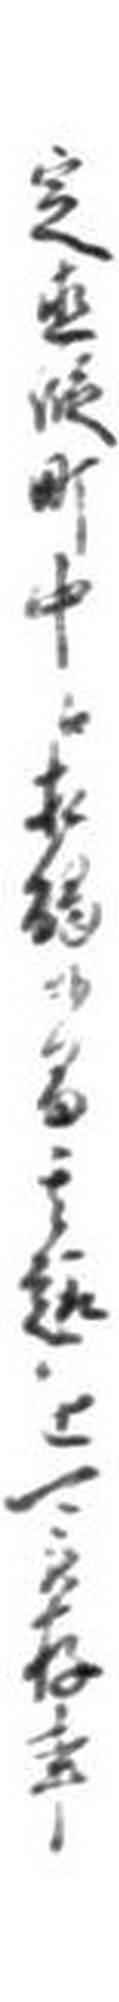定直段町中江相触候間其趣を可被存事
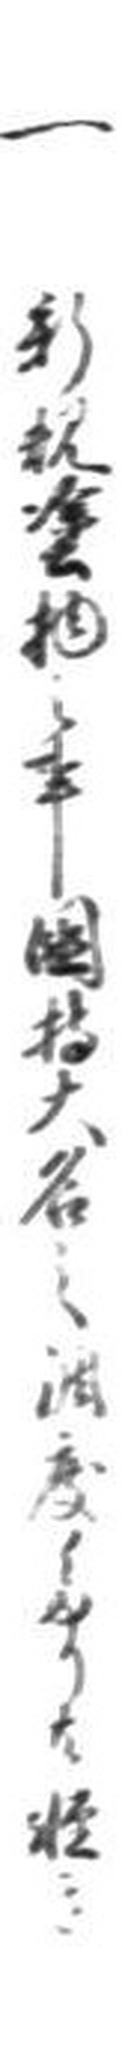一新規塗物之事国持大名之調度たり共軽き
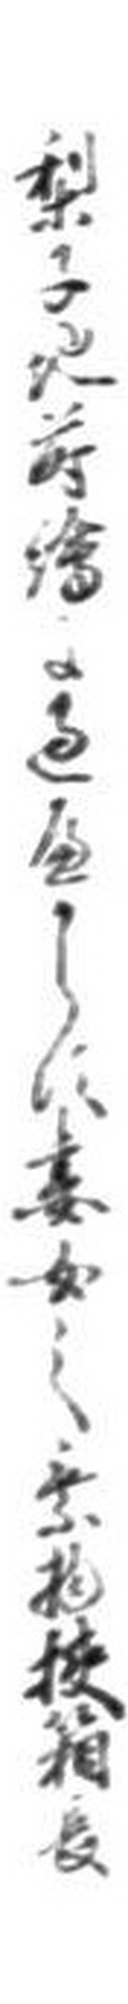梨子地蒔絵に過へからす妻女之乗物挟箱長
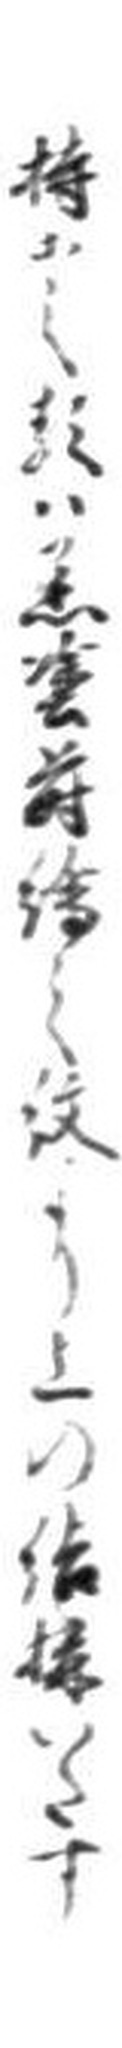持等之類ハ黒塗蒔絵之紋より上の結構いたす
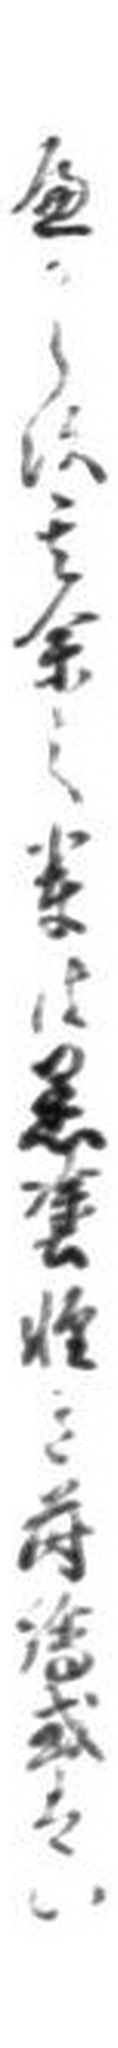へからす其余之輩は黒塗軽き蒔絵或はい
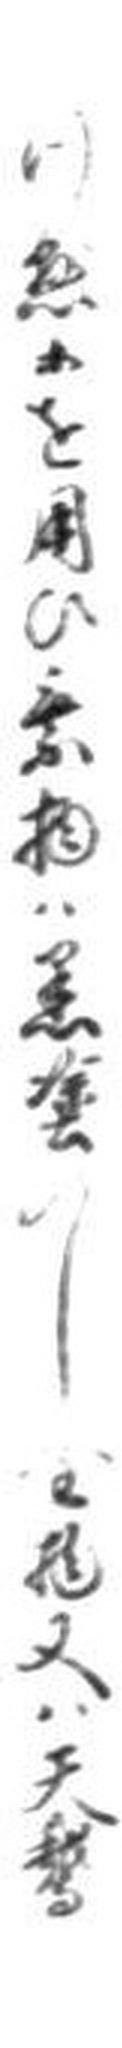つ懸等を用ひ乗物ハ黒塗いし金物又ハ天鵞
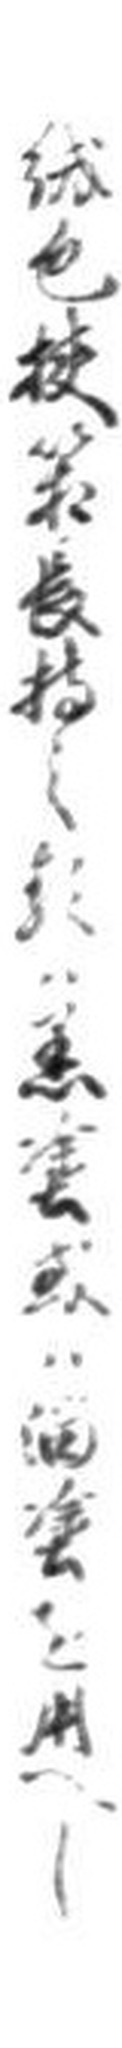絨色挟箱長持之類ハ黒塗或ハ溜塗を用へし
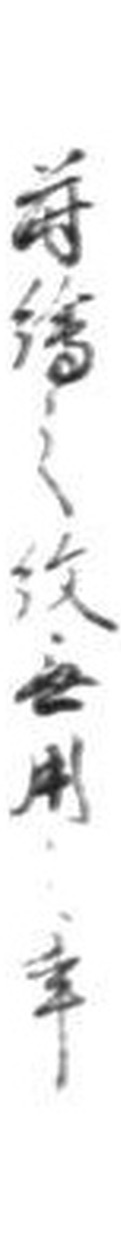蒔絵之紋無用之事

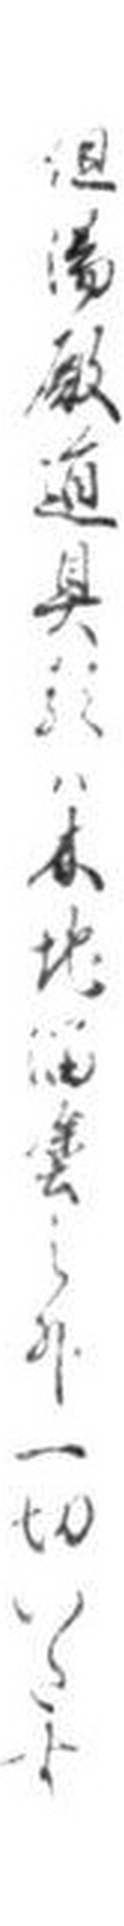但湯殿道具類ハ木地溜塗之外一切いたす
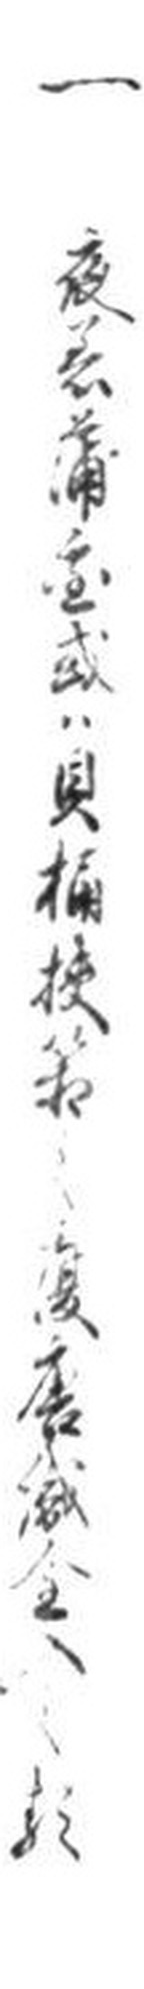一夜着蒲団或ハ貝桶挟箱之覆唐織金入之類
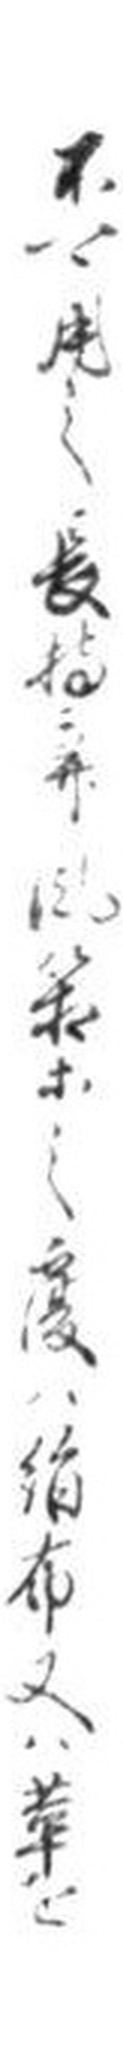不可用之長持屏風箱等之覆ハ絹布又ハ革を
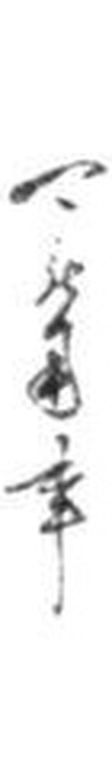可被用事
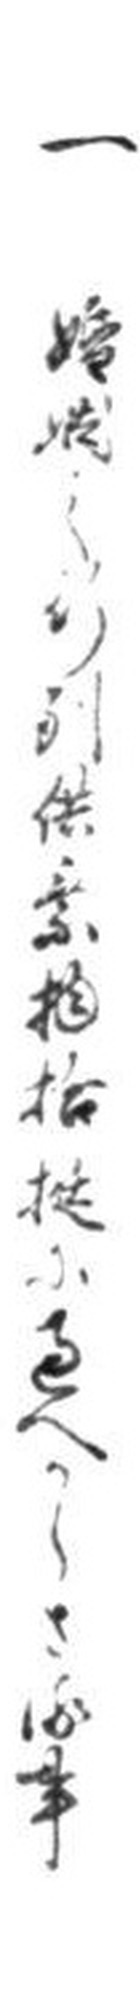一婚姻之行列供乗物拾挺に過へからさる事
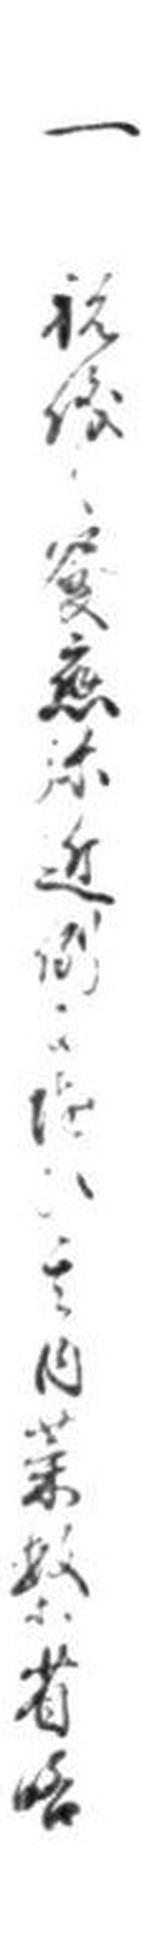一祝儀之饗応弥近例に随ひ其内菜数等省略
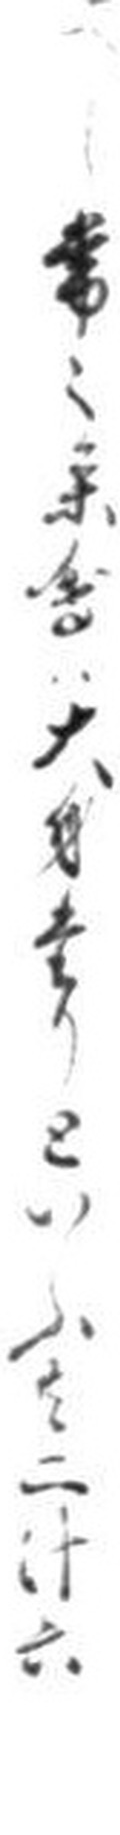すへし常々参会ハ大身たりといふ共二汁六
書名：家譜 三十八 宗矩公 従享保九年五月到享保九年十二月
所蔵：福井県文書館 Fukui Prefectural Archives
